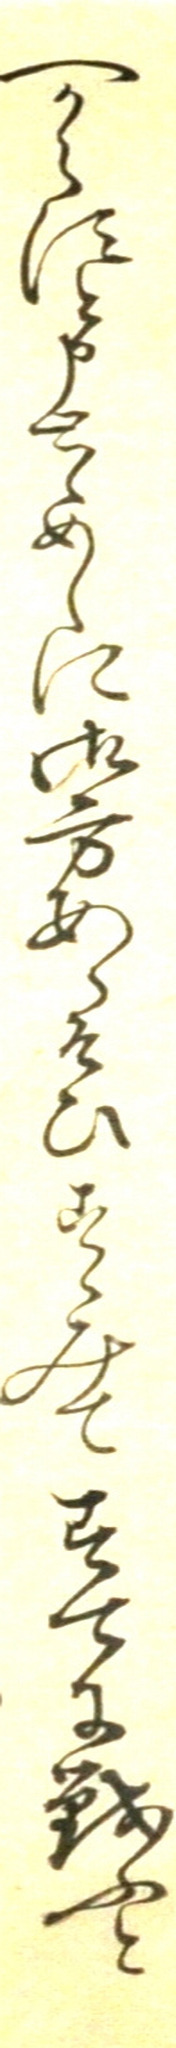へからすと申とゝめしに御方あらそひすゝみてすてに戦ふと
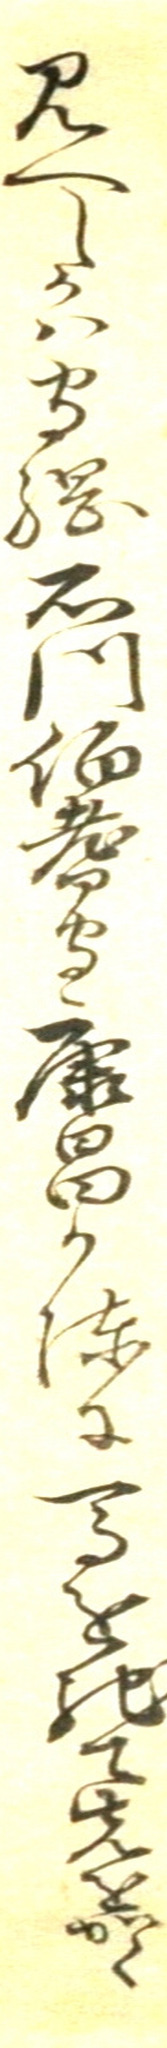見へしかは守綱石川伯耆守康昌か陣に馬を馳て先をかく
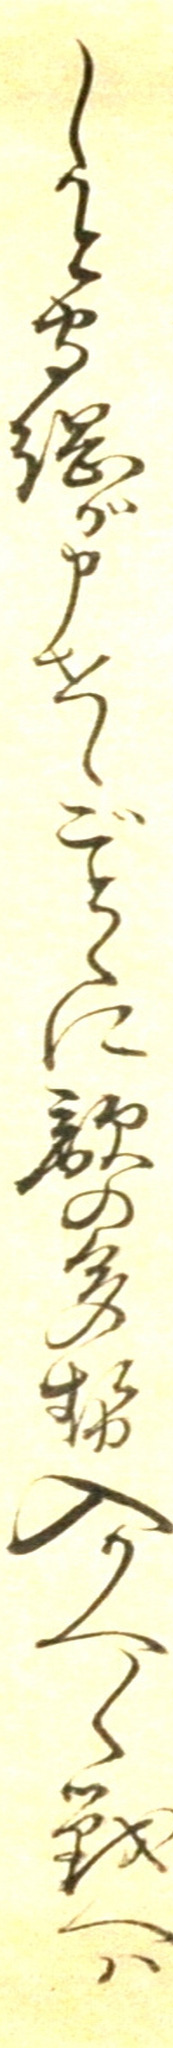しかと守綱が申せしごとくに敵の多勢入かへ〳〵戦へは
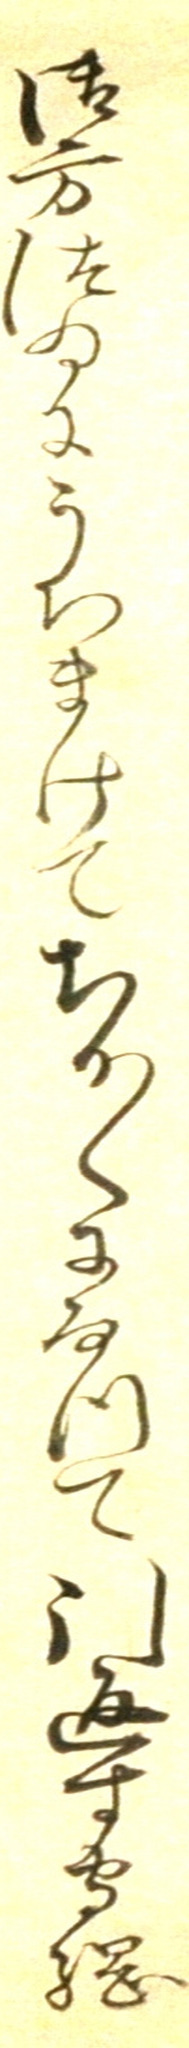御方つゐにうちまけてちり〳〵になつて引返す守綱
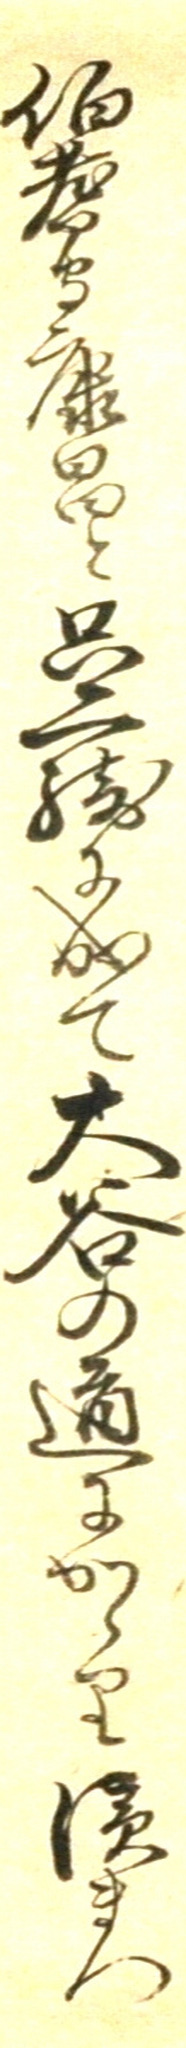伯耆守康昌と只二騎に成て大谷の道にかゝり浜まつ
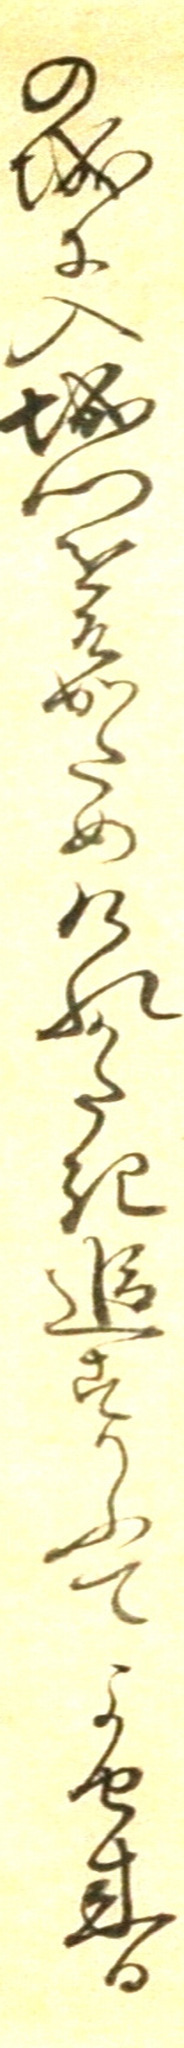の城に入城門をそかためけれかたき追すかふてよせ来る
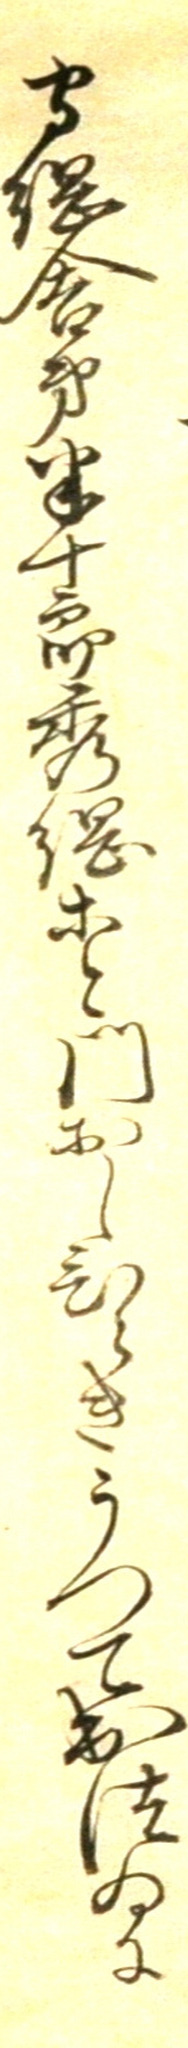守綱舎弟半十郎秀綱等と門おしひらきうつて出つゐに
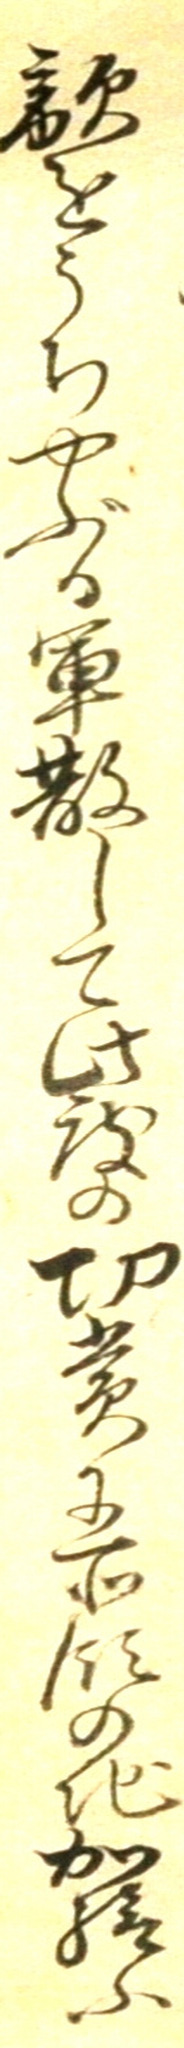敵をうちやぶる軍散して此度の功賞に所領の地加給ふ

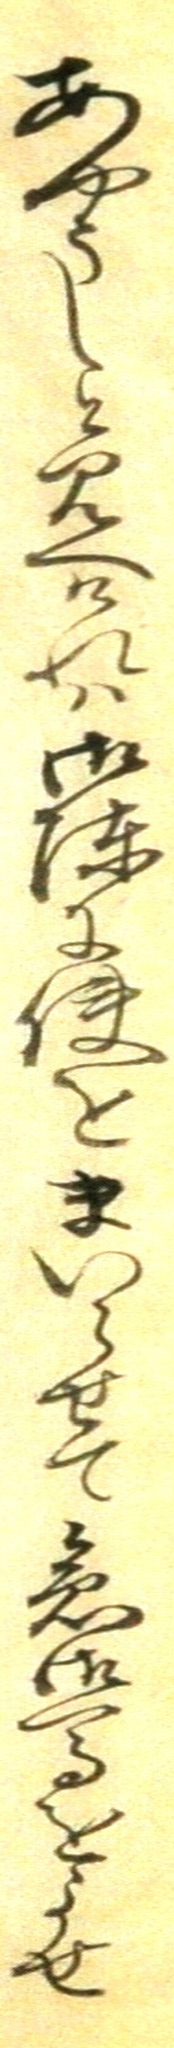あやうしと見へけれは御陣に使をまいらせて急御馬をよせ
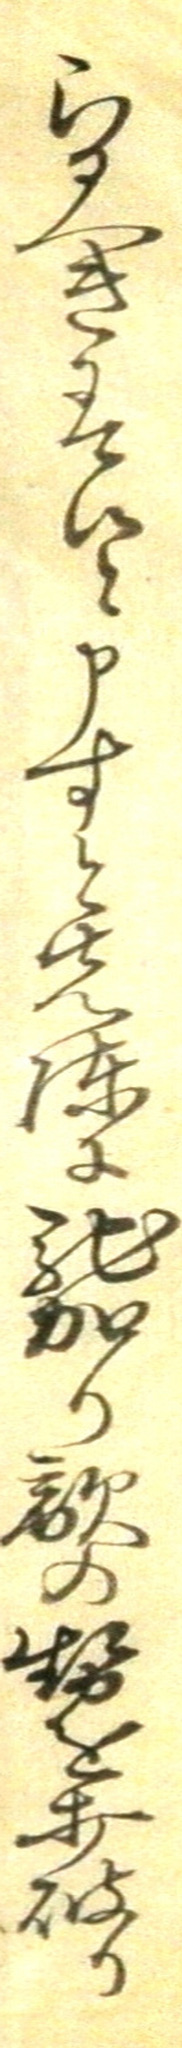らるへきにて候と申すと先陣に馳加り敵の勢を打破り
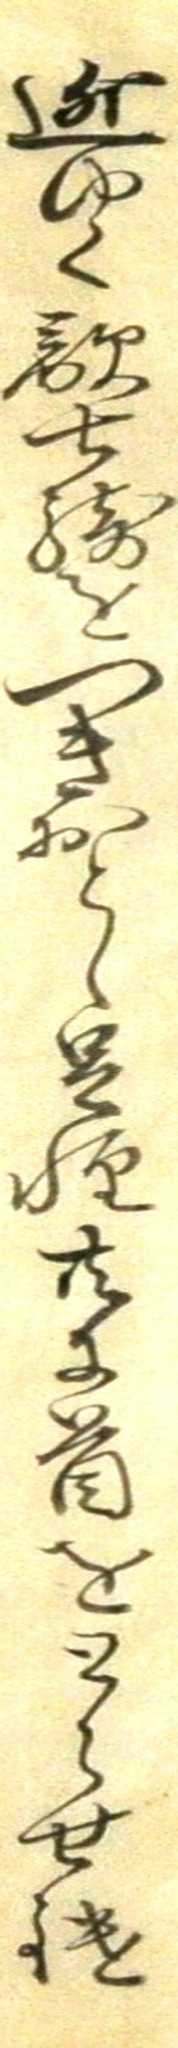逃ゆく敵七騎をつきおとし足軽共に首をとらせ鑓
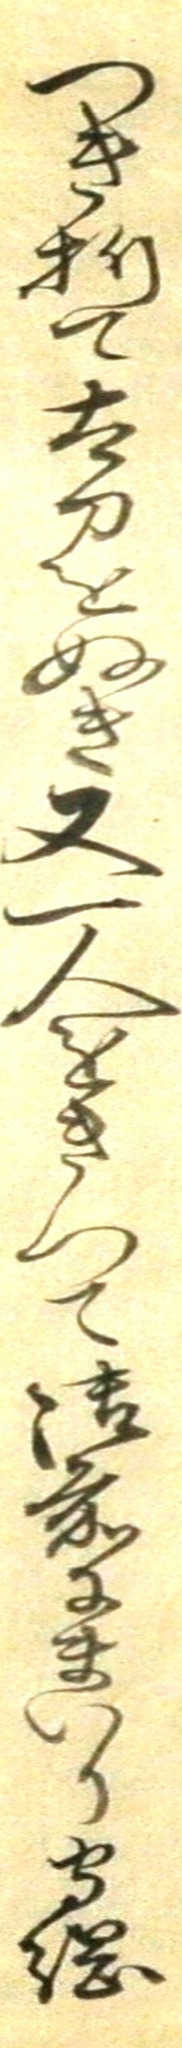つき折て太刀をぬき又一人をきつて御前にまいり守綱
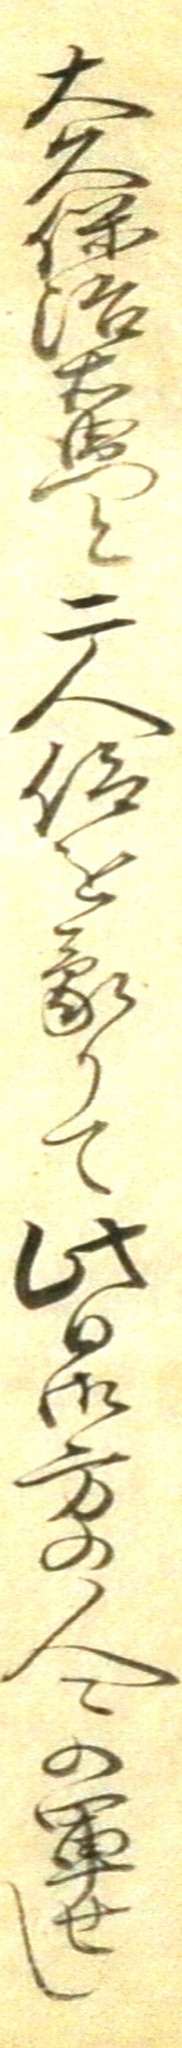大久保治右衛門と二人仰を蒙りて此日御方の人々の軍せし
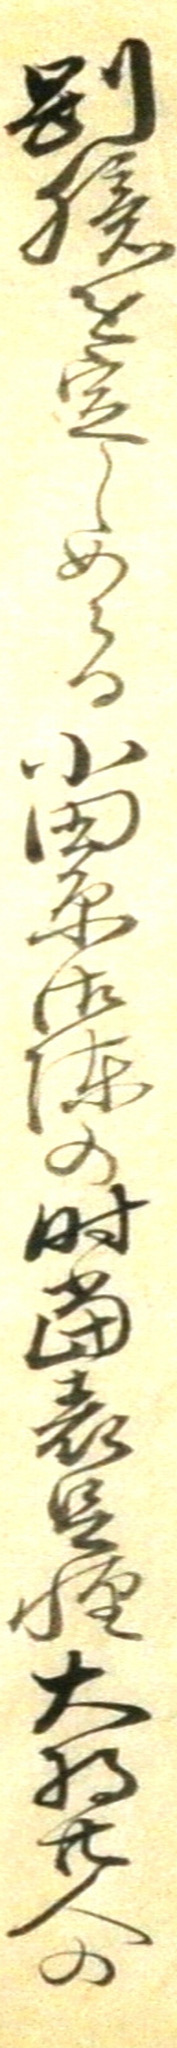剛臆を定しめらる小田原御陣の時当表足軽大将廿人の
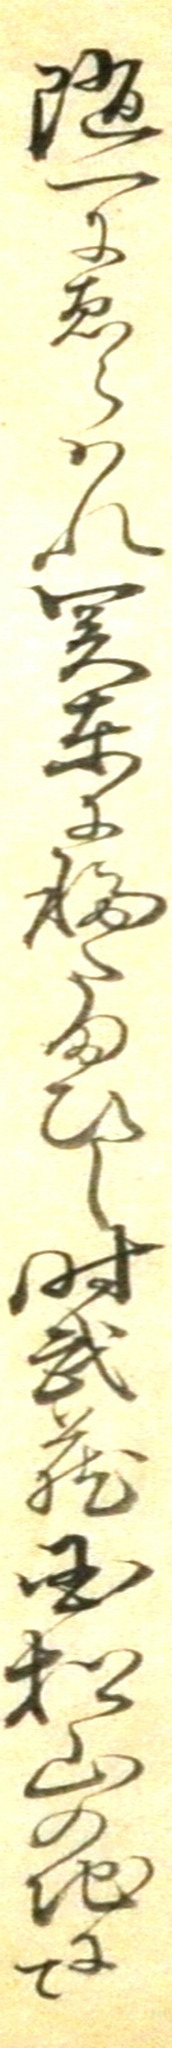随一にゑらはれ関東に移たまひし時武蔵国松山の地にて
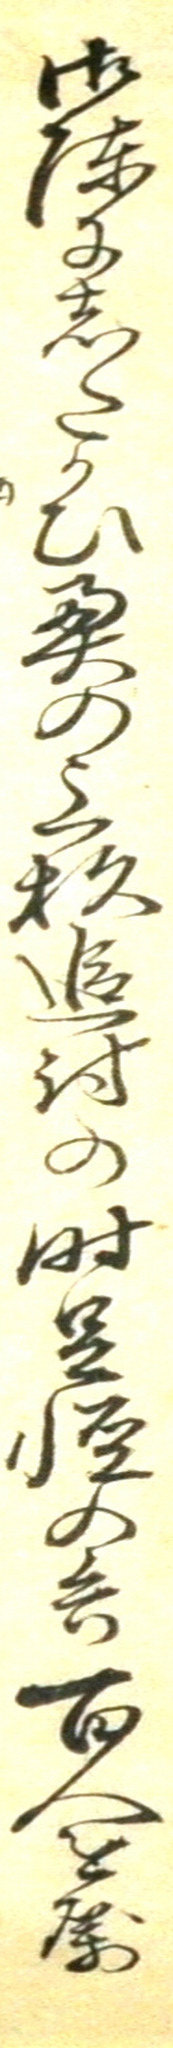御陣にしたかひ奥の上杉追討の時足軽の兵百人を属
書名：藩翰譜（四・中）
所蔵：伊那市立高遠町図書館・合同会社AMANE
